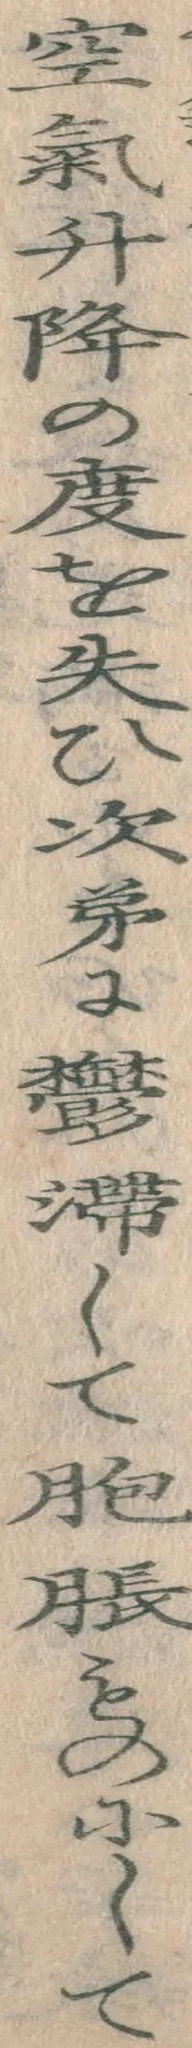空気升降の度を失ひ次第に鬱滞して胞張ものにして

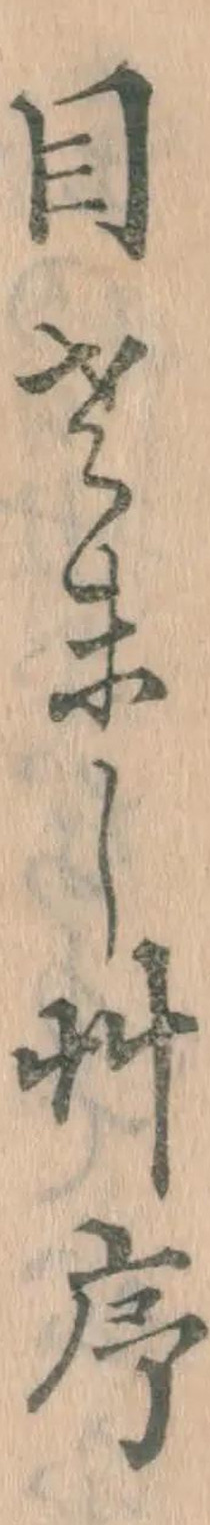目さまし艸序
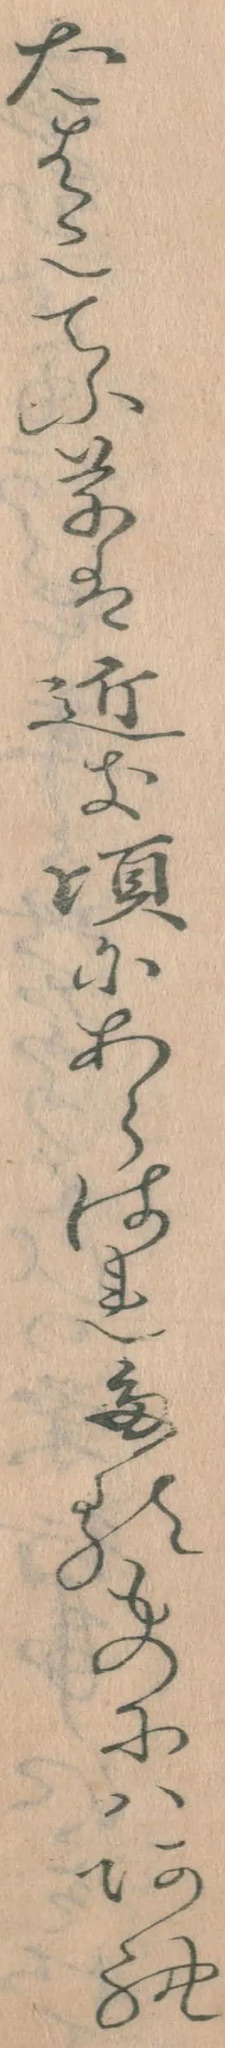たはこてふ草は近き頃にあらはれたるものにはあれ
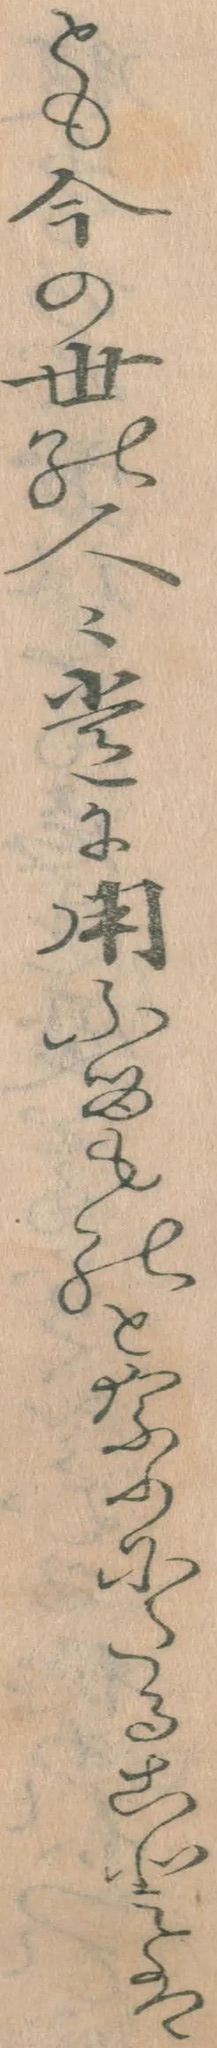とも今の世の人々常に用ふるものとなりにたることは
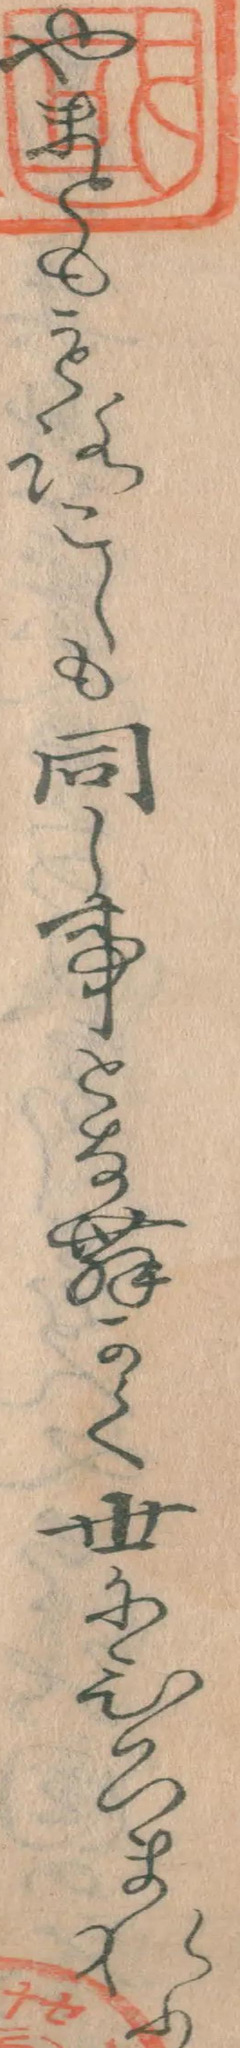やまとももろこしも同し事となむかく世にひろまれり
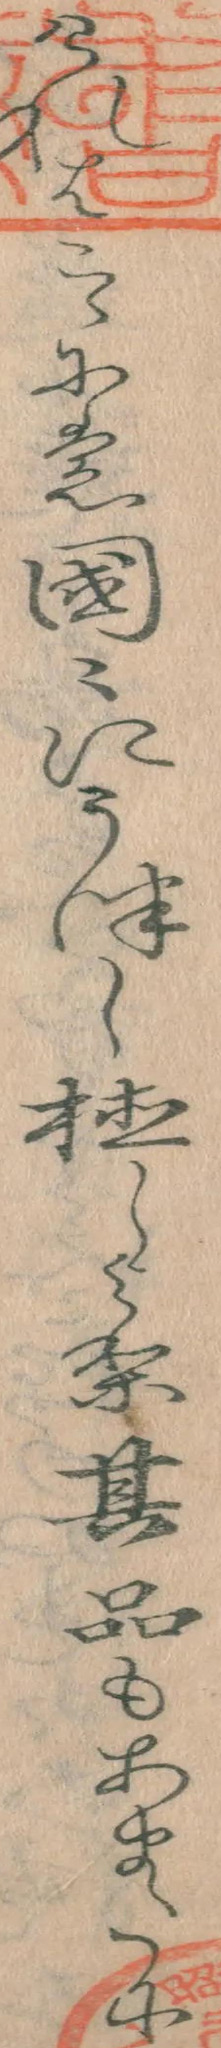けれはこゝに急国々にうつし植しより其品もあまたに
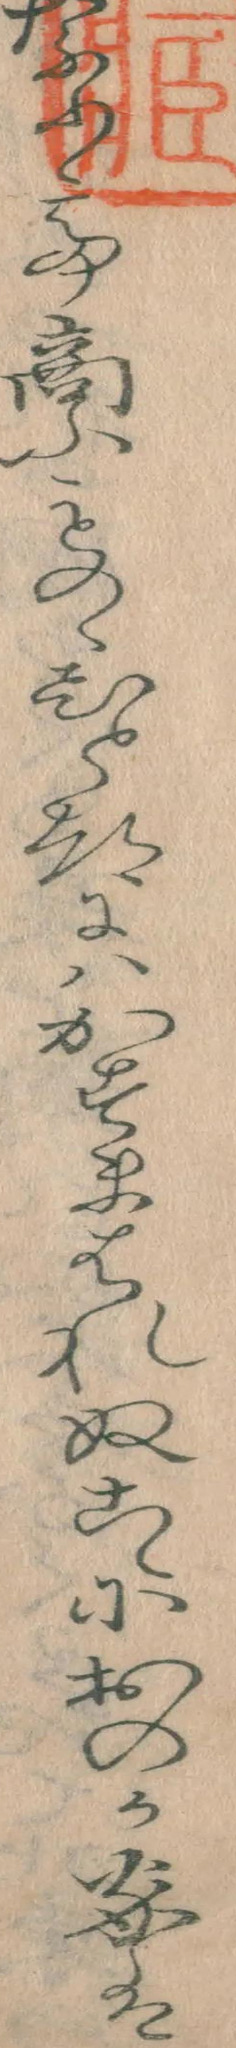なりて商ふものゝひとつにはかすまはれぬこゝにおのか家は
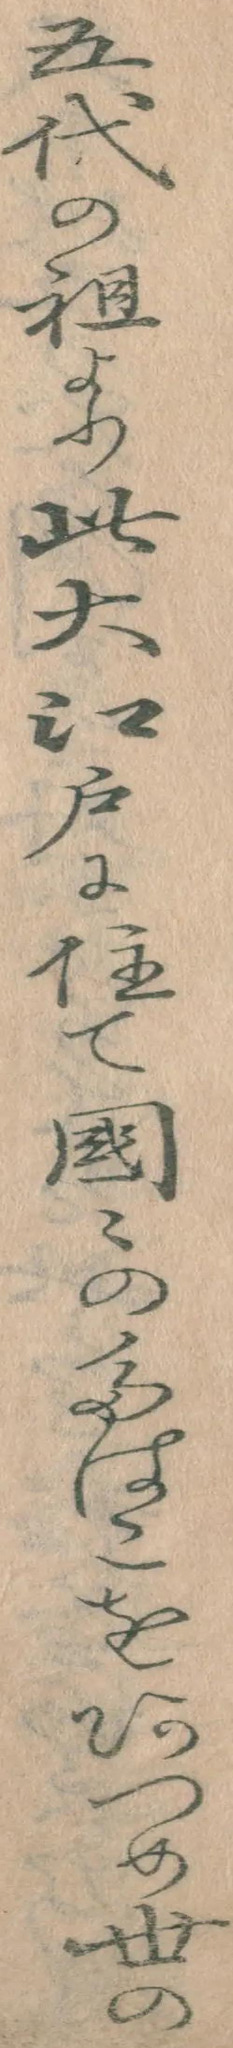五代の祖より此大江戸に住て国々のたはこをあつめ世の
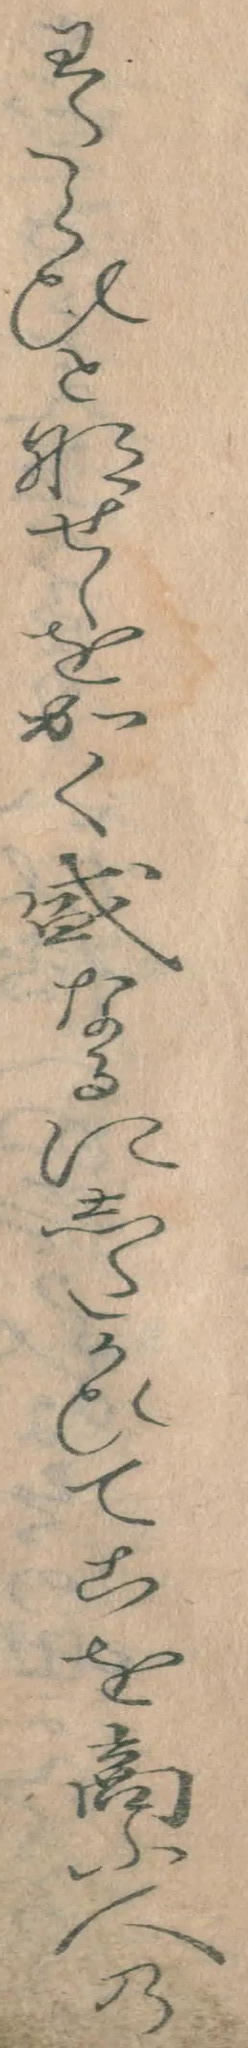わたらひとなせしをかく盛なるにしたかひてこを商ふ人の
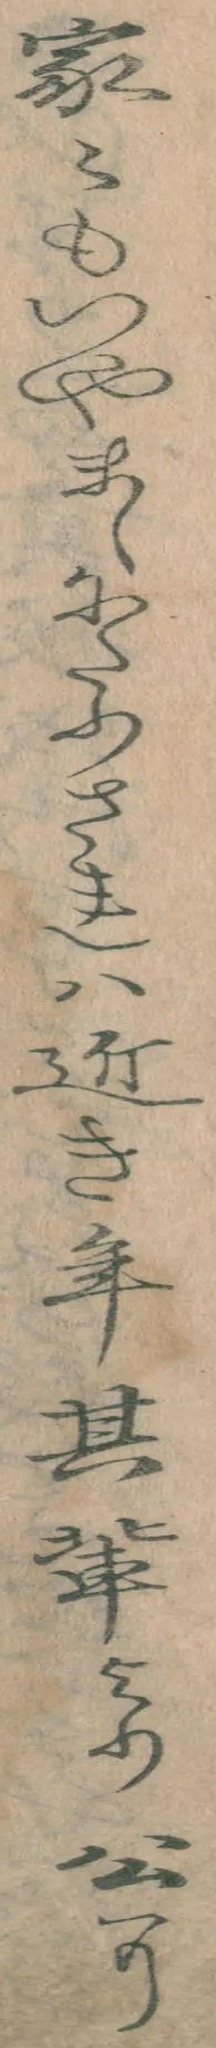家々もいやましにたりされは近き年其輩より公に

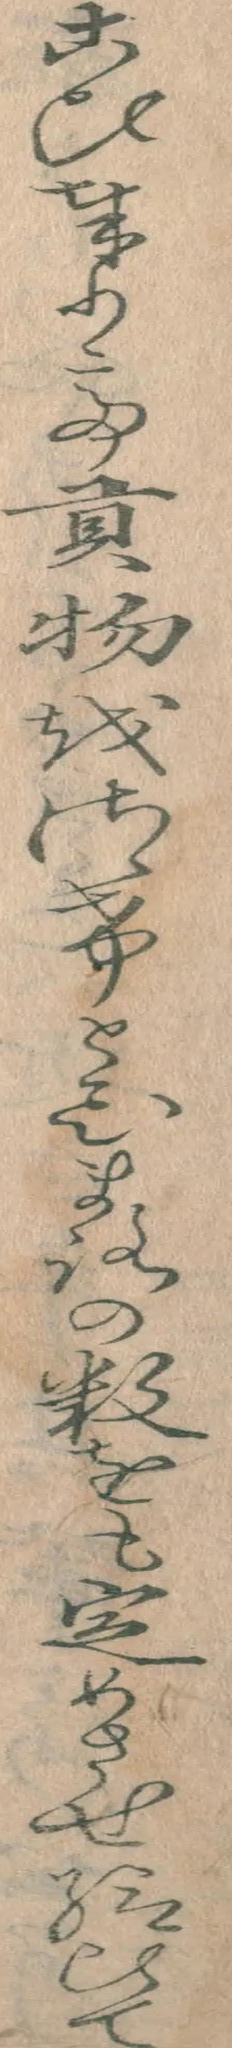こひ奉りて貢物をさけとひまろの数をも定めさせ給ひて
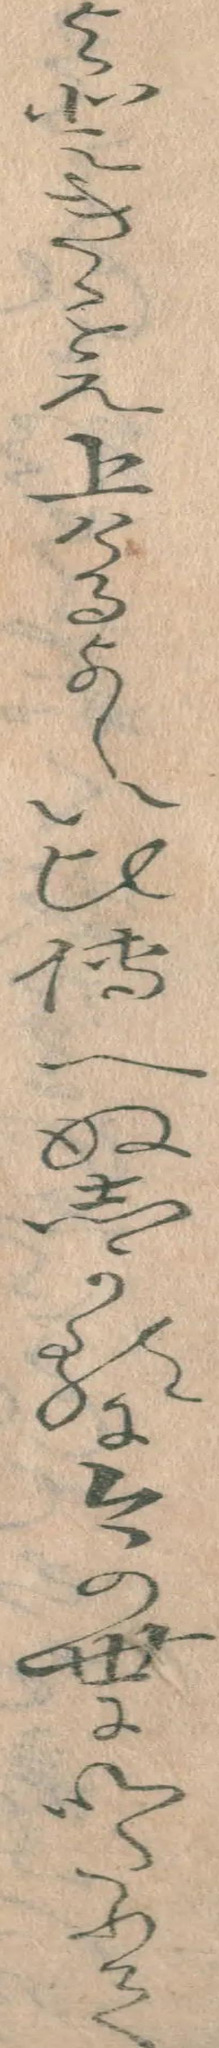よときことえ上けるよしいひ伝へぬしかるに今の世にいたりて
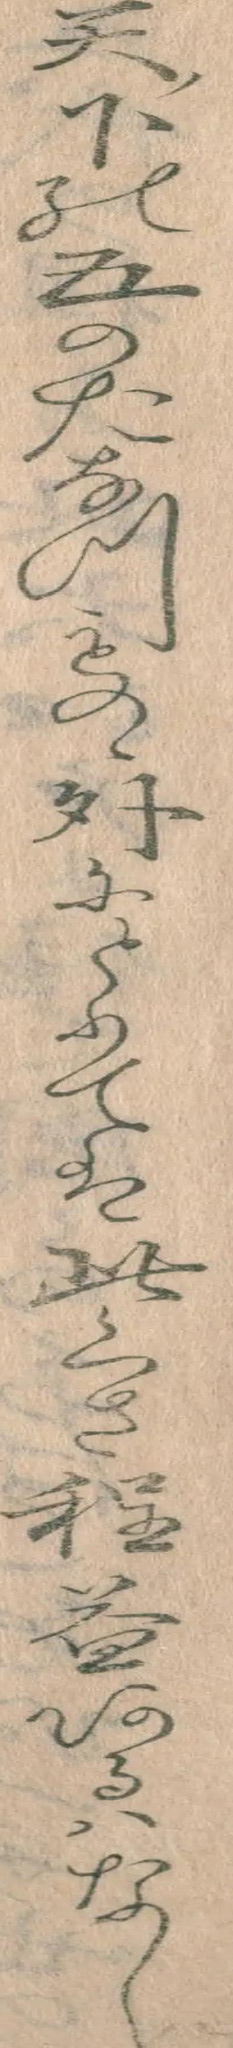天下の五のたなつものゝ外にとりては此くさ程益あるはなし
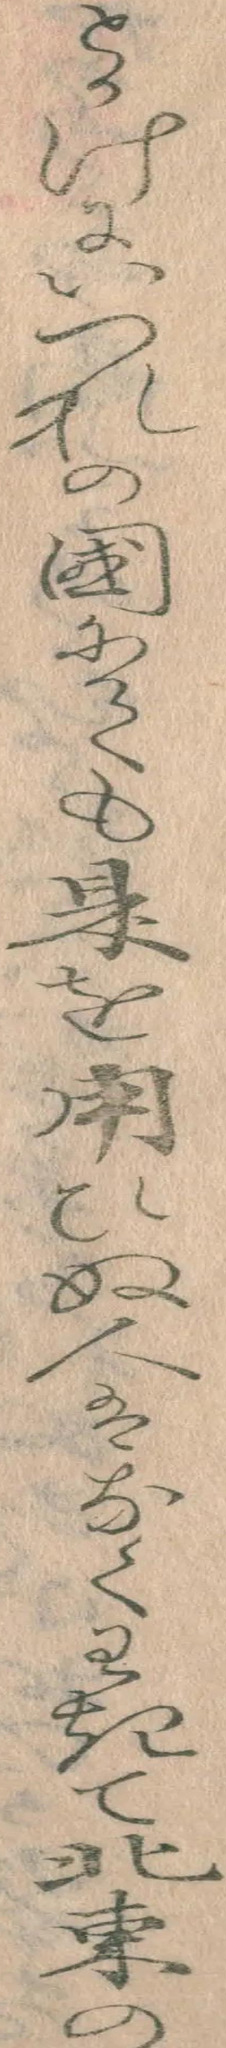とかけにいつれの国にても是を用ひぬ人はなくわきて北東の
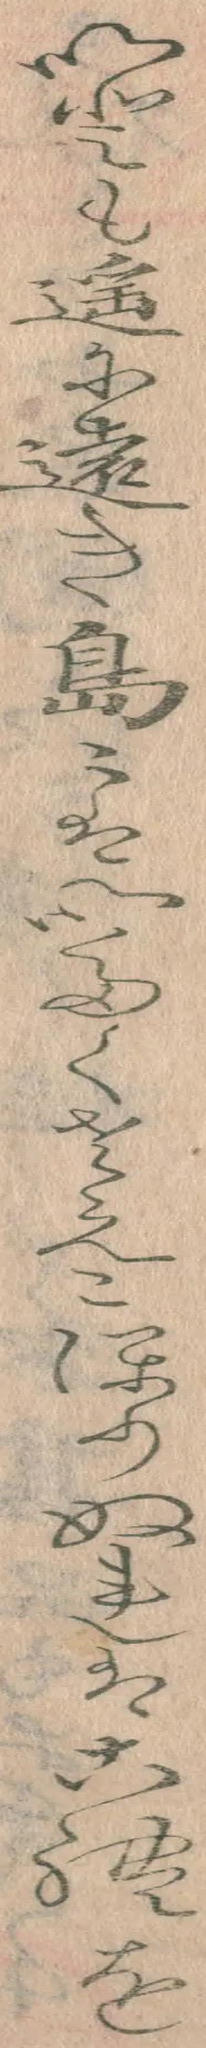いとも遥に遠き島々はいたくさえこほりぬれはこれを
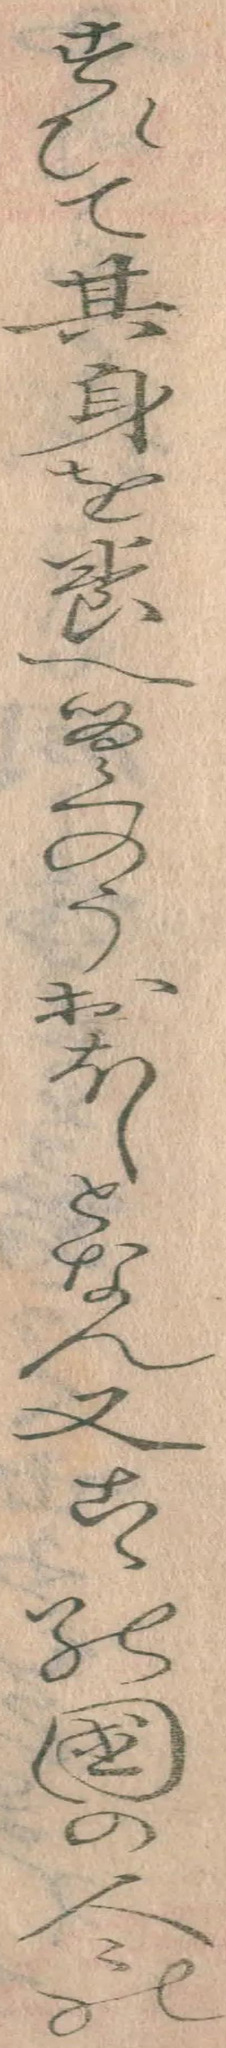すひて其身を養へるくのうおほしとなん又こゝの国の人々の
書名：目さまし草
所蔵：国立国会図書館 National Diet Library, JAPAN
